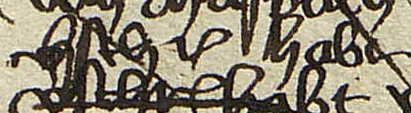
v*ſchr* habt
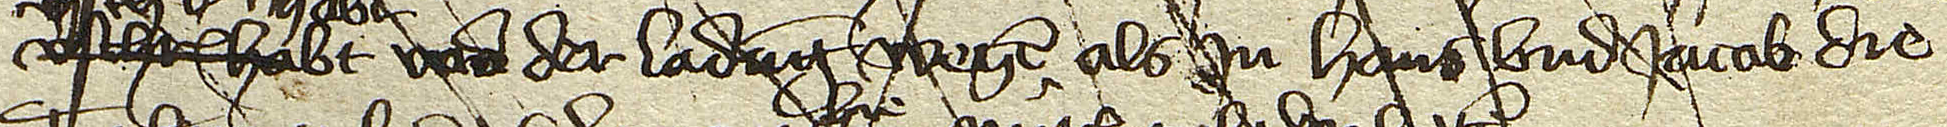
v*ſchr* habt von der ladung wege* als In hans vnd Iacob die
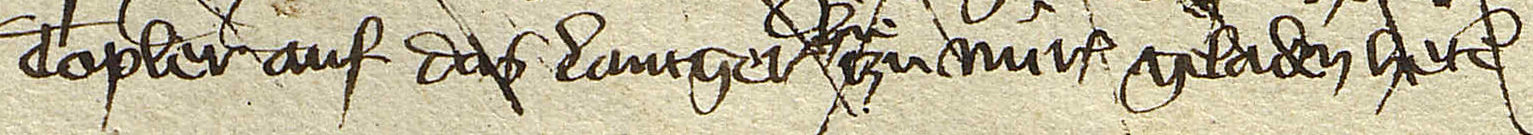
Topler auf das Lantger* cʒu Nür* geladen hete*
